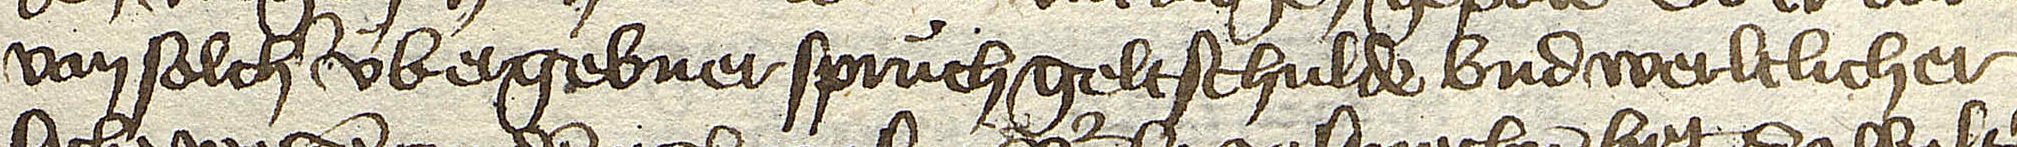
von ſolch* v̈bergebner ſprüch gelt ſchulde vnd werltlicher
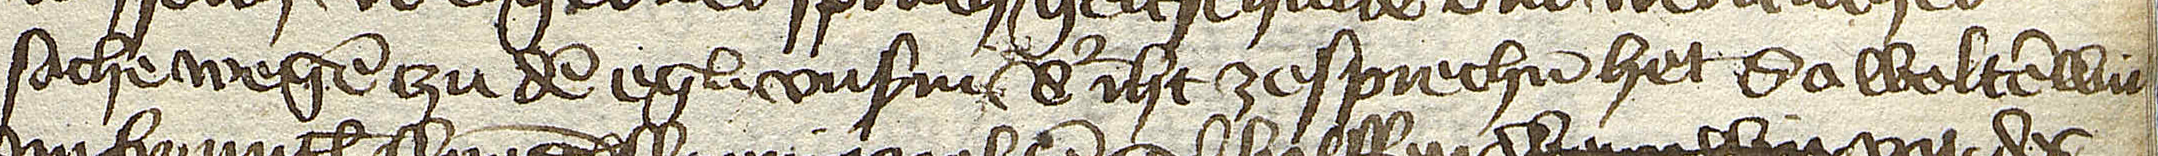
ſache wege* cʒu d* eg* ~ vnſ*m B* iht cʒeſprechn* het So wolte* wir
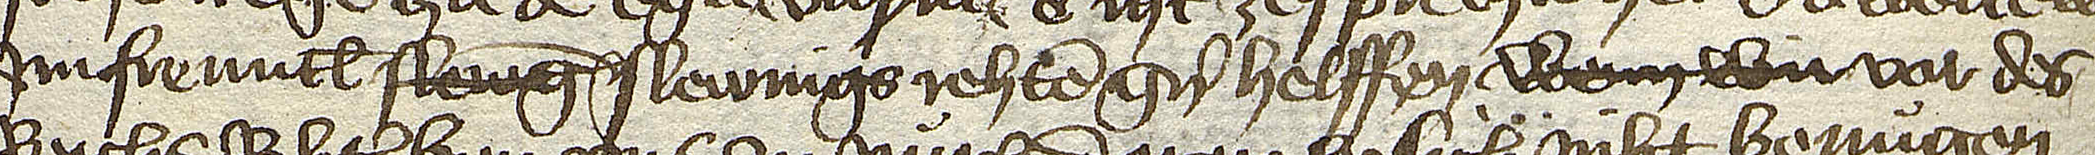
Im freuntl* ſleuig* ſlewnigs rehte* gn* helffen / wenn wir vor des
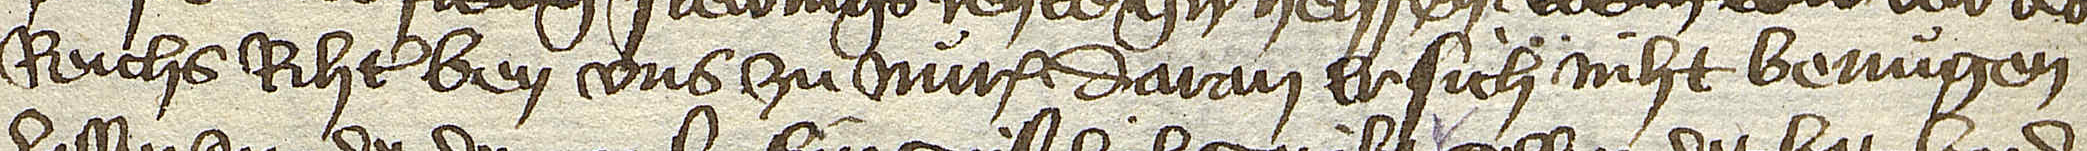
Reichs Riht* bey vns cʒu Nür* daran Er ſich niht benügen
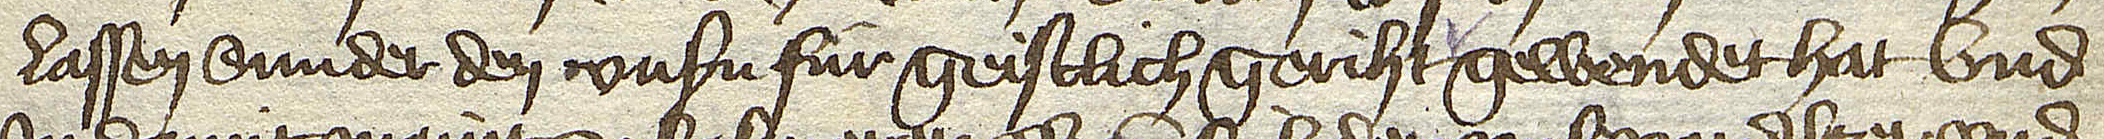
laſſen Sunder den vnſ*n für geiſtlich geriht gewendet hat vnd
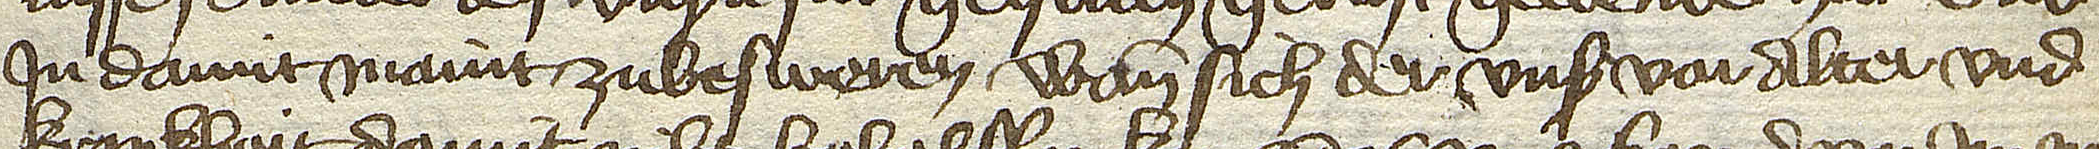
In damit maint cʒubeſweren / wan* ſich der vnſ* von Alter vnd
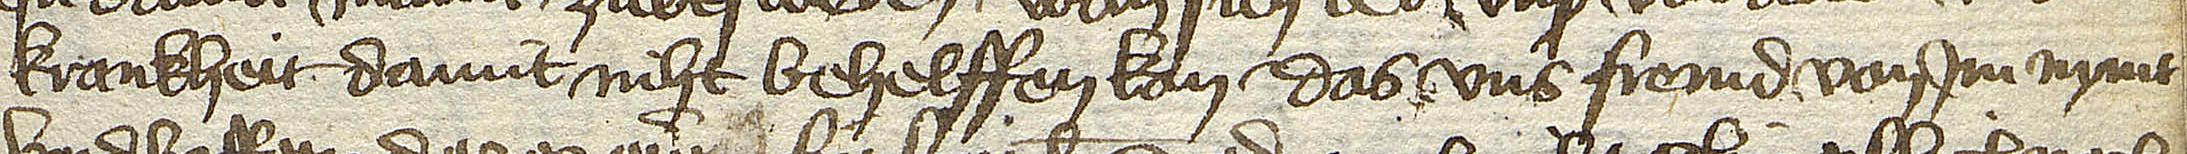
krankheit damit niht behelffen kan / das vns fremd von Im nymt
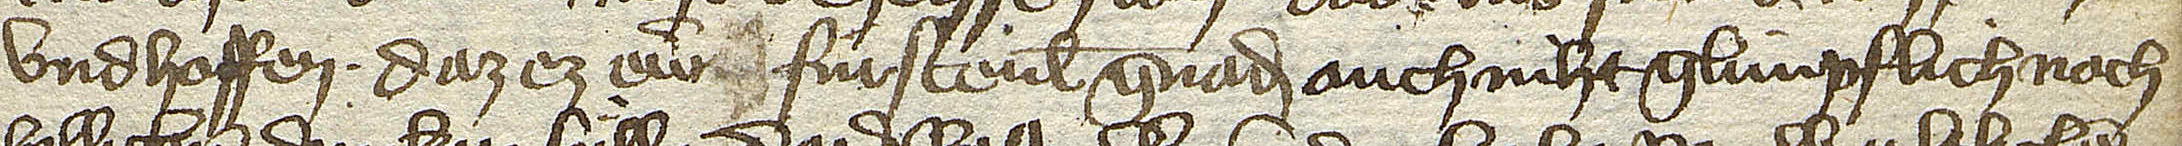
vnd hoffen . daʒ eʒ ewr* fürſtenl* gnad* auch niht glimpflich noch
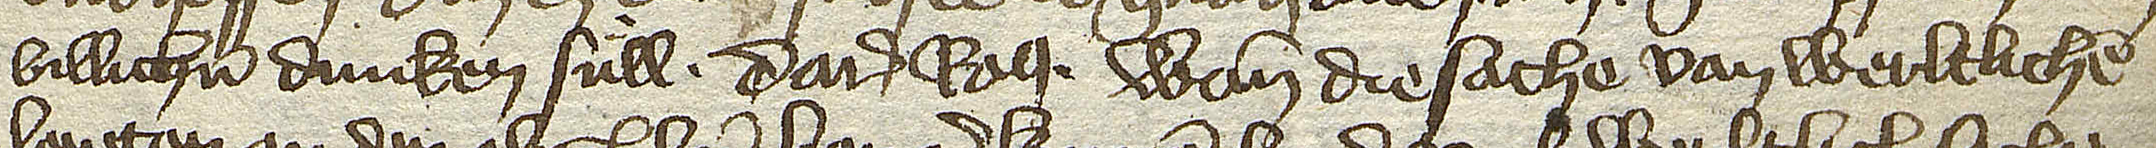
billichn* dunken ſüll . Dar* Ro* . Wan* die ſache von werltliche*
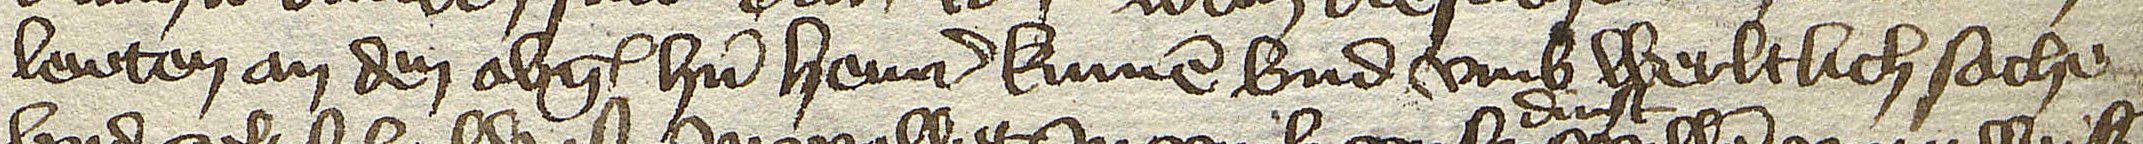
lewten an den obg* hn* heinr* kume* vnd vmb werltlich ſache
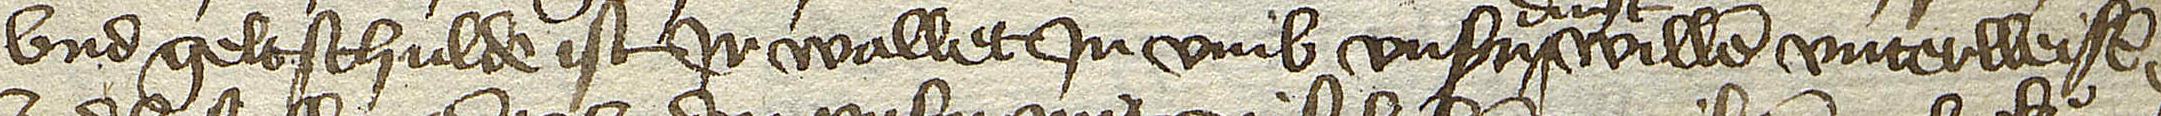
vnd gelt ſchulde iſt Ir wollet In vmb vnſ*n wille* vnterweiſe*
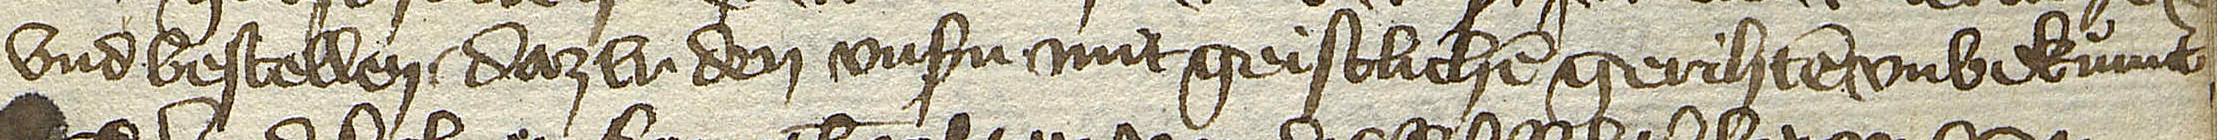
vnd beſtellen / daʒ Er den vnſ*n mit geiſtliche* gerihte* vnbeküm*t
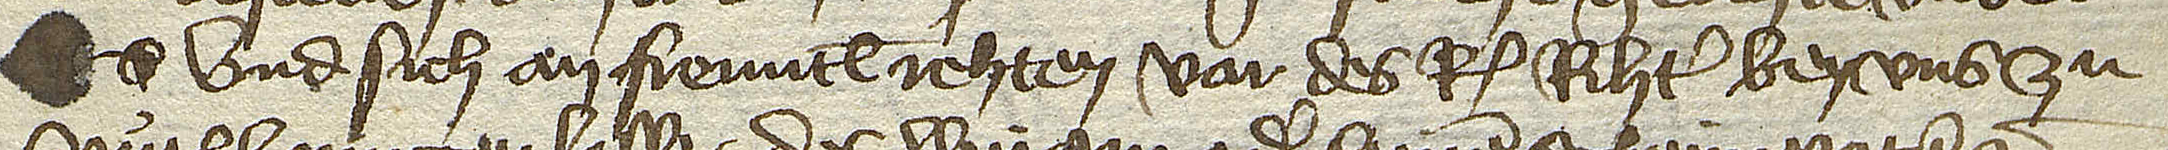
s vnd ſich an freuntl* rehten vor des R* Riht* bey vns cʒu
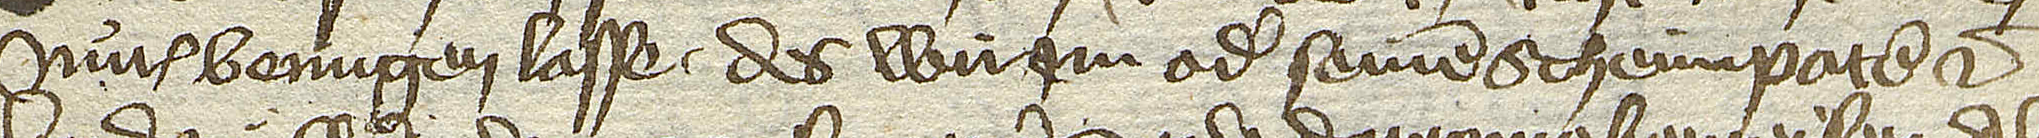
Nür* benügen laſſe / des wir Im od* ſeine* Scheimpote* ec*
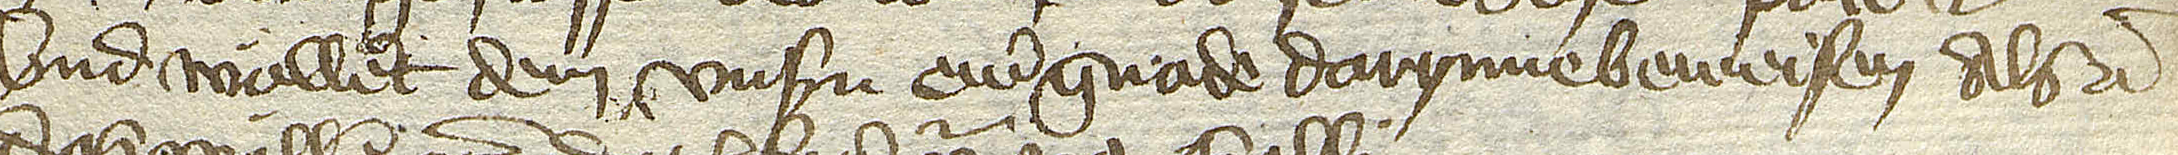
vnd wöllet dem vnſ*n ew* gnade darynne beweiſen Als ec*
